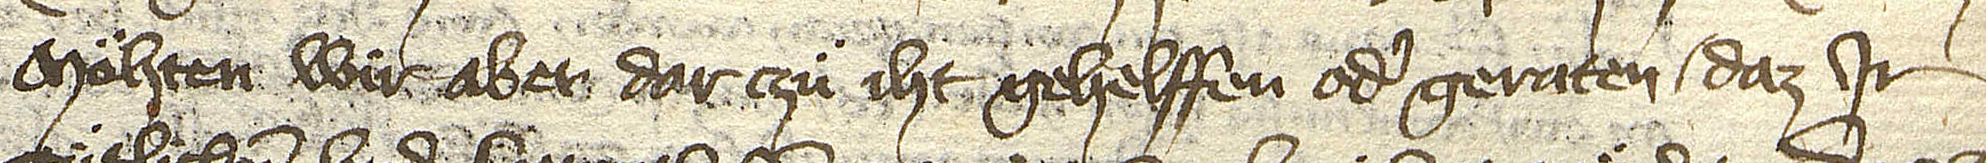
Möhten wir aber dar cʒü iht gehelffen od* geraten / daʒ Ir
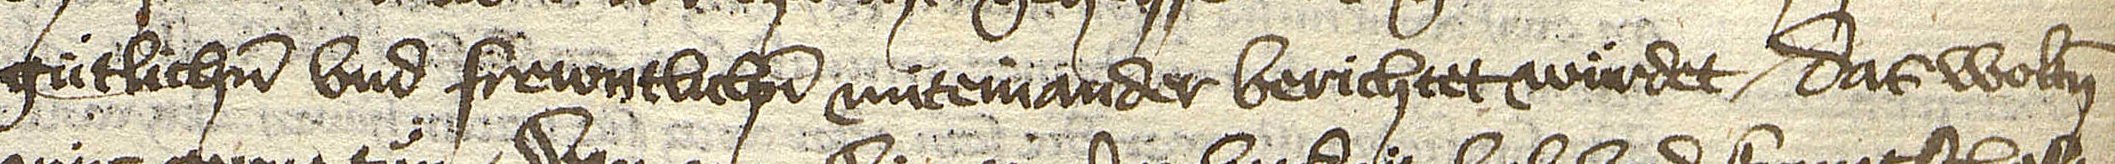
gütlichn* vnd frewntlichn* miteinander berichtet würdet / das woltn*
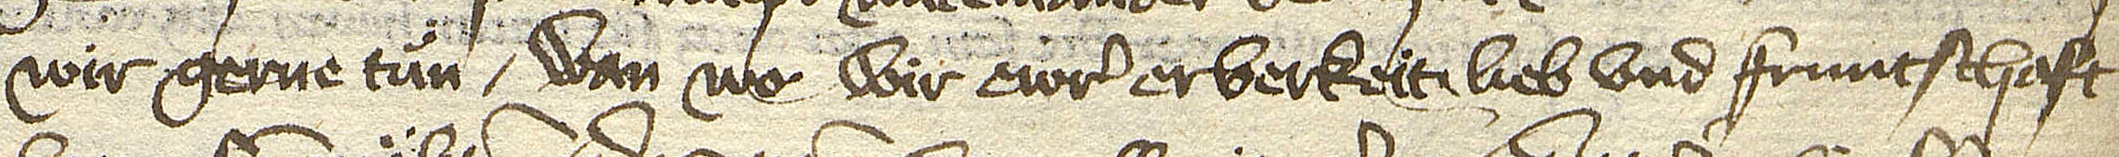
wir gerne tün / wan wo wir ewr* erberkeit lieb vnd fruntſchaft
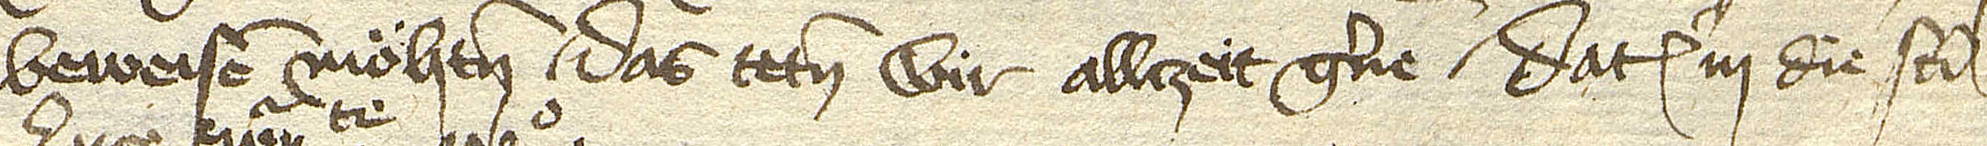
beweiſe* möhtn* / Das tetn* wir allcʒeit gne* / Dat* in die ſci*
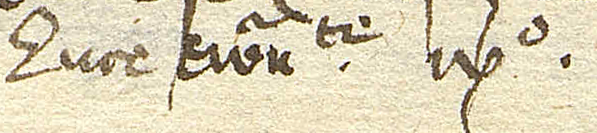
Lu%% ewn* . ix* .
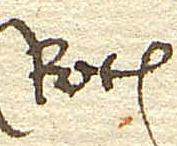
Rot*
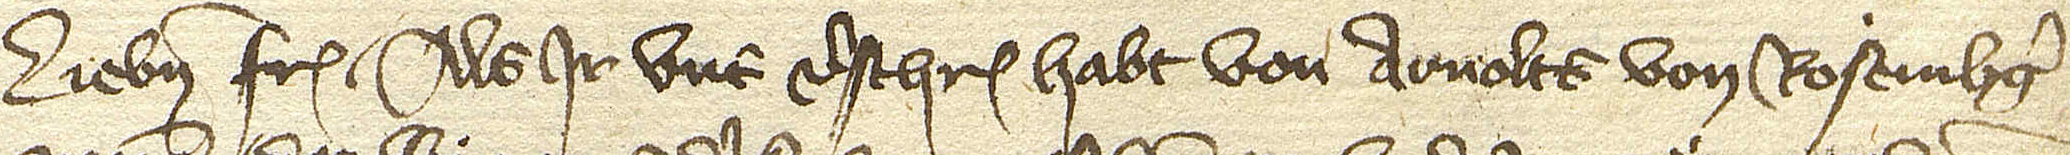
Liebn* fr* / Als Ir vns v*ſchr* habt von Arnolts von Roſembg*
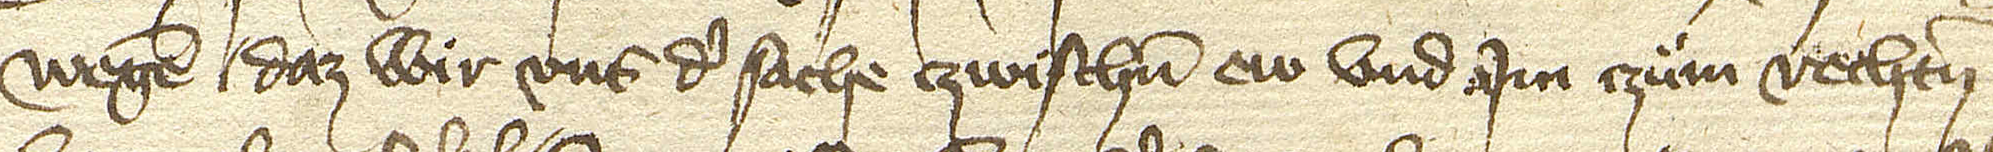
wege* / daʒ wir vns d* ſache cʒwiſchn* ew vnd Im cʒüm rechtn*
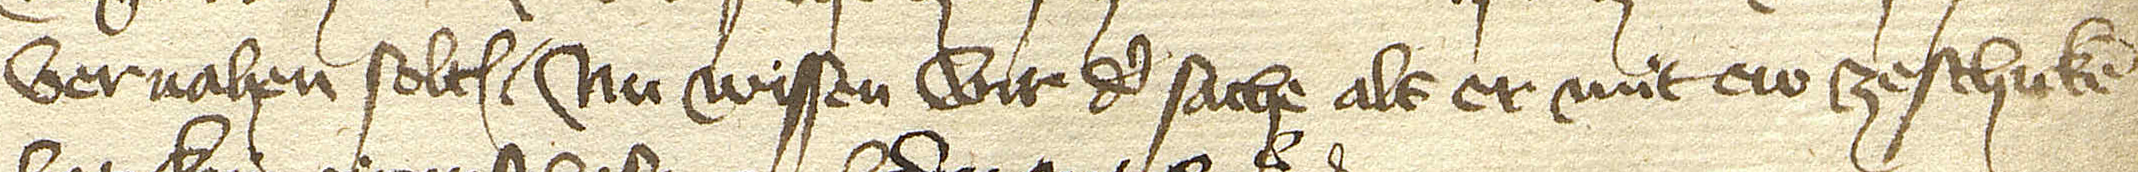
veruahen ſolt* / Nu wiſſen wir d* ſache als er mit ew cʒeſchicke*
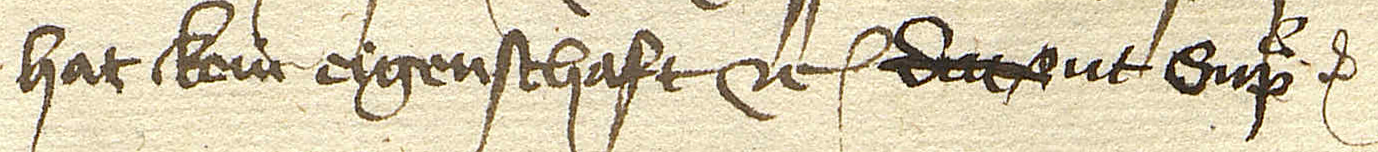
hat / kein eigenſchaft ec* dat* ut Sup* §
